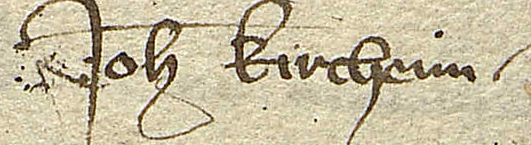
Ioh* kircheim /
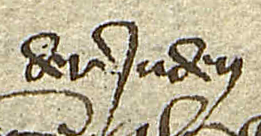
der Iuden
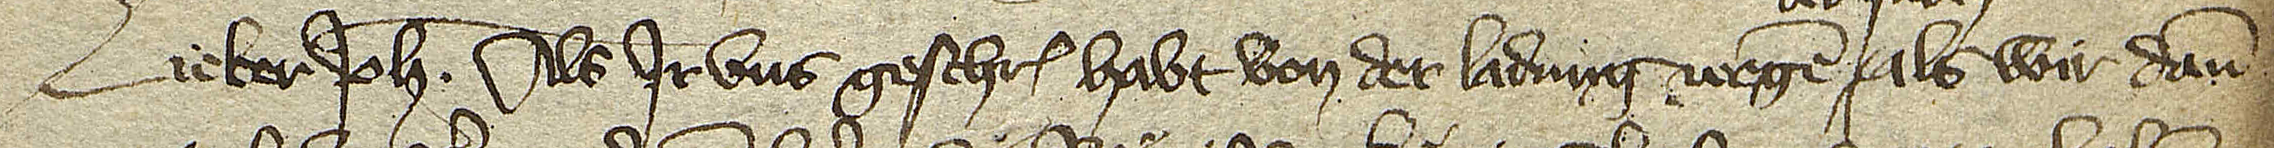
Lieber Ioh. Als Ir vns geſchr* habt von der ladung wege* / als wir dan*
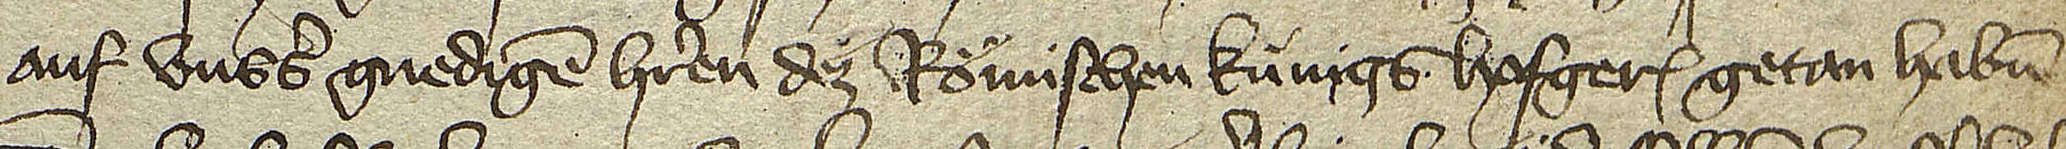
auf vns*s gnedige* hr*en deʒ Römiſchen künigs hofger* getan habn*
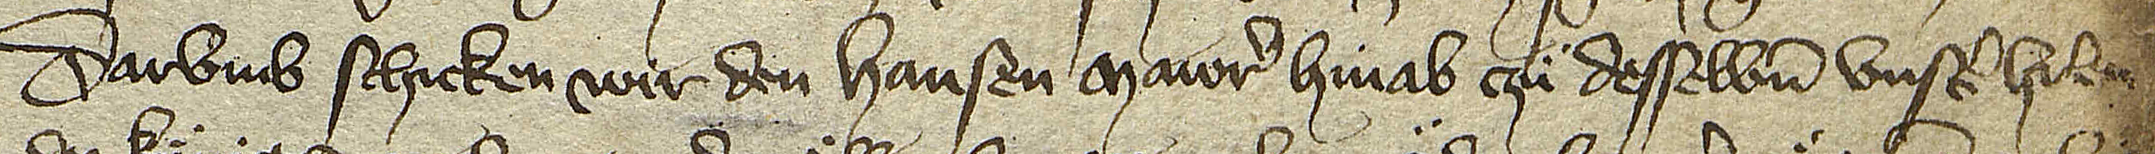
Darvmb ſchicken wir den hanſen Mawr* hinab cʒu deſſelbn* vnſ*s hr*en
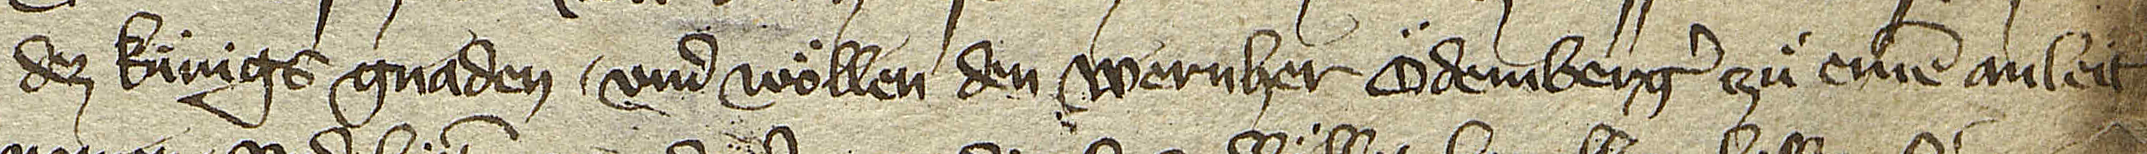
deʒ künigs gnaden / vnd wöllen den wernher Ödemberg* cʒü eine* anleit
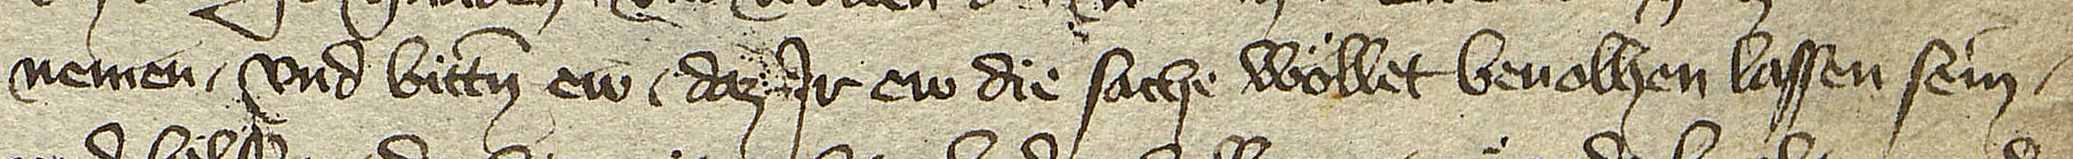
nemen / vnd bittn* ew / daʒ Ir ew die ſache wöllet beuolhen laſſen ſein /
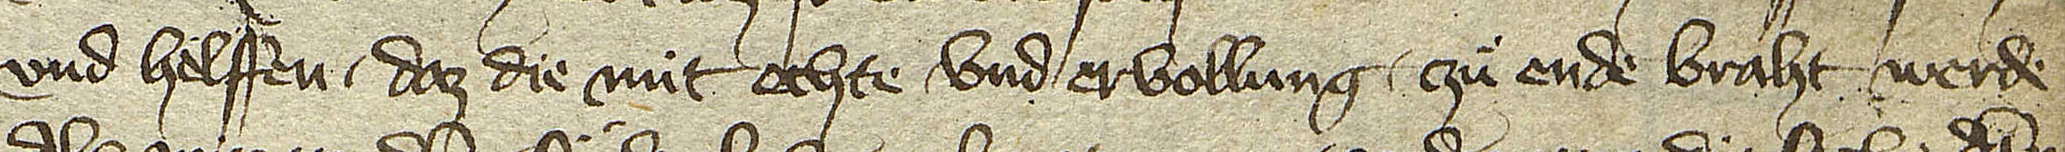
vnd helffen / daʒ die mit echte / vnd ervollung / cʒü ende braht werde
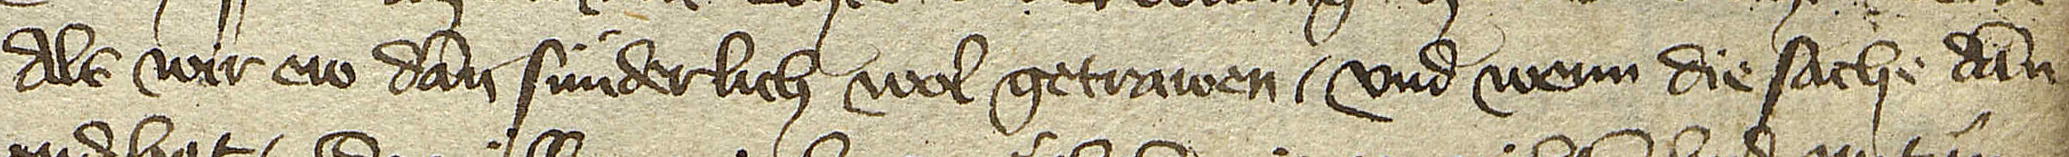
Als wir ew dan* ſünderlich wol getrawen / vnd wenn die ſache dan*
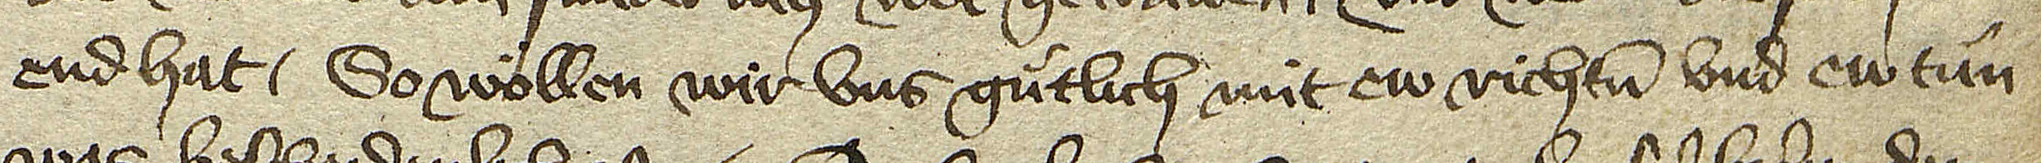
end hat / So wöllen wir vns gütlich mit ew richtn* vnd ew tün
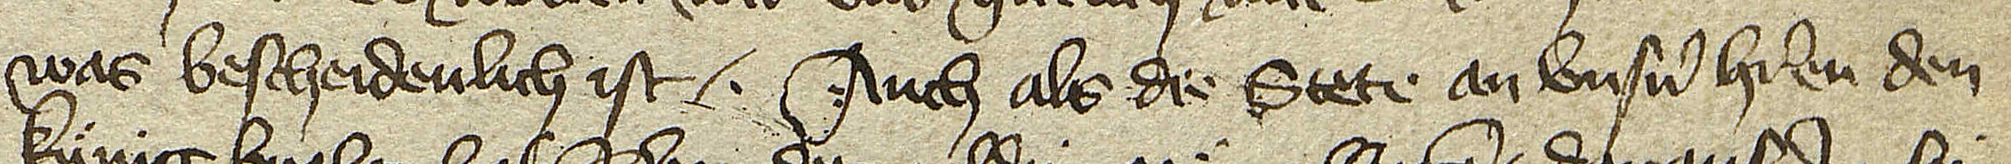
was beſcheidenlich iſt /. Auch als die Stete an vnſn* hr*en den
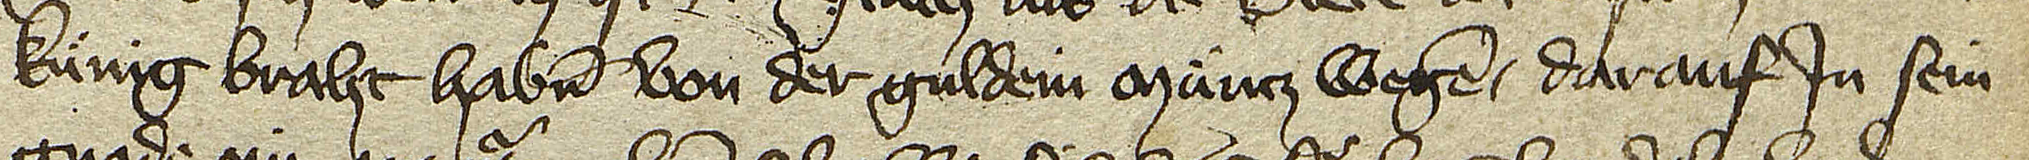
künig braht habn* von der guldein Müncʒ wege* / darauf In ſein
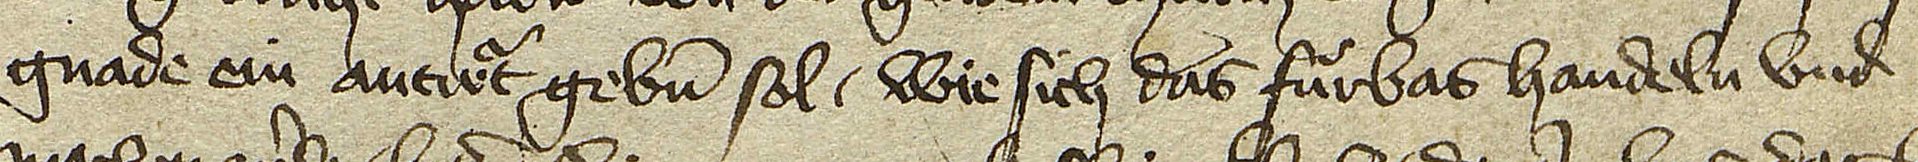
gnade ein antw*t gebn* ſol / wie ſich das fürbas handeln vnd
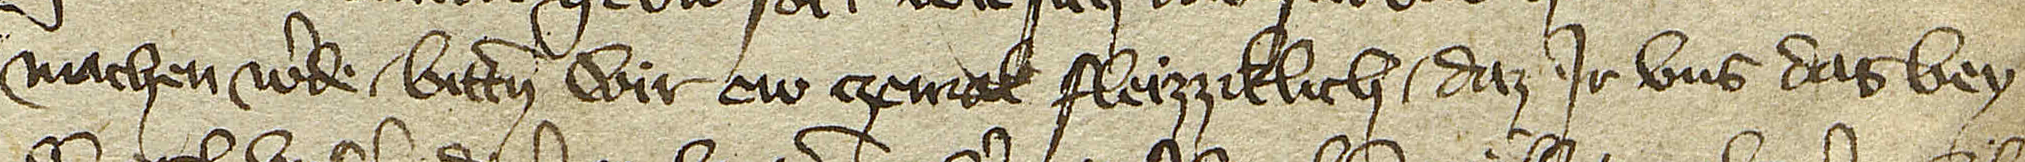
machen w*de / bittn* wir ew cʒemal fleiʒʒiklich / daʒ Ir vns das bey
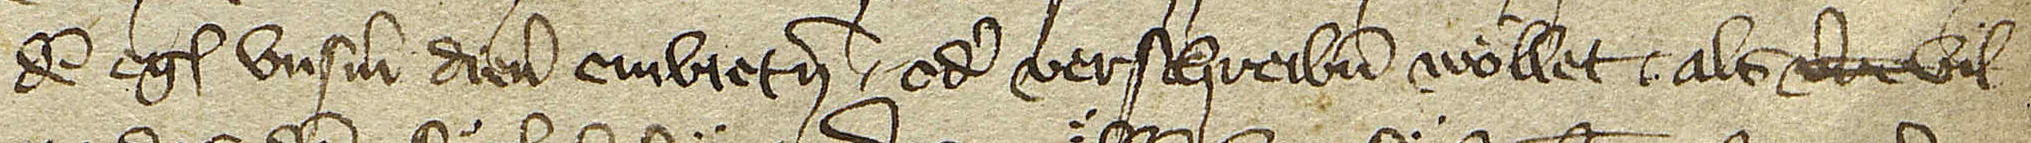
d* eg* vnſm* dien* embietn* / od* verſchreibn* wöllet / als v*re vil
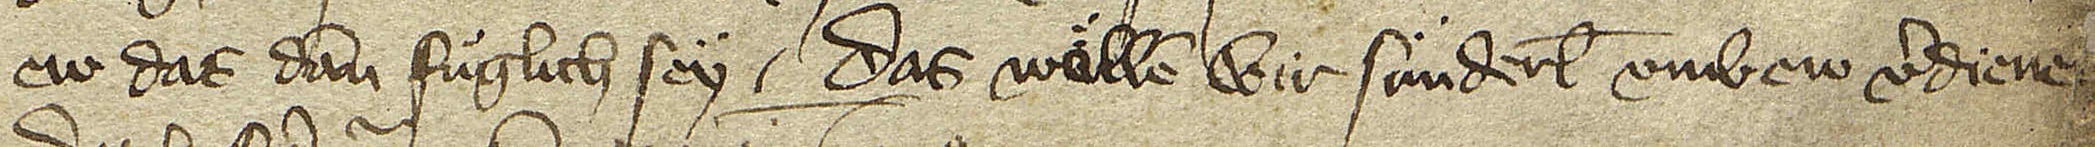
ew das dan* füglich ſey / Das wölle* wir ſünderl* vmb ew v*dienen
